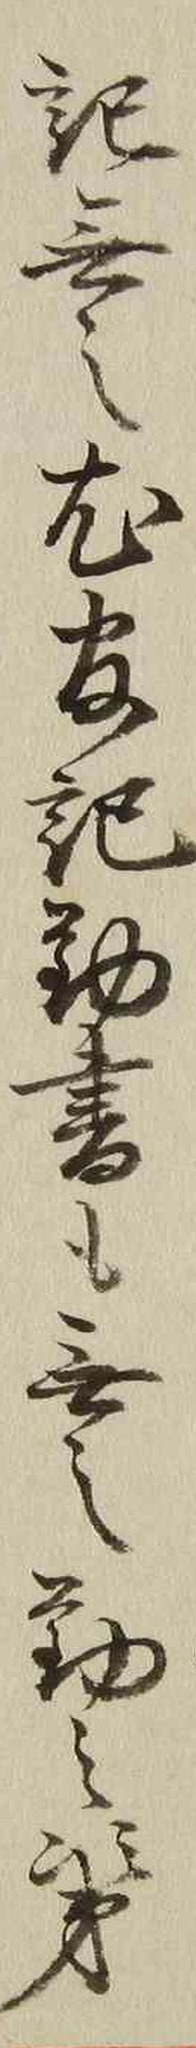記無之尤官記勤書も無之勤之次第
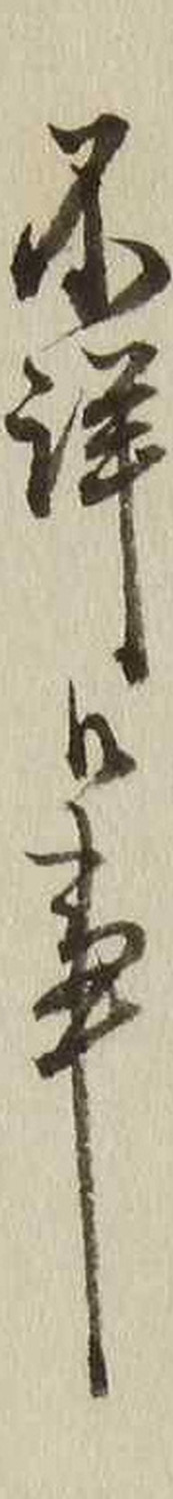不詳候事
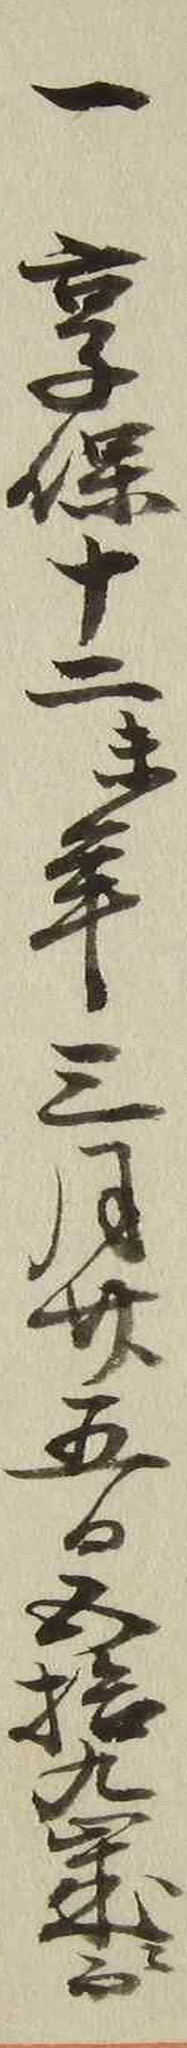一享保十二未年三月廿五日五拾九歳ニ而
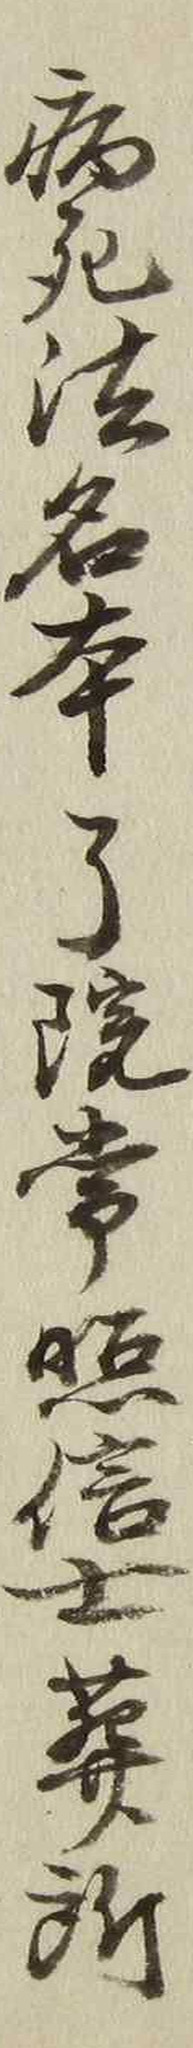病死法名本了院常照信士葬所
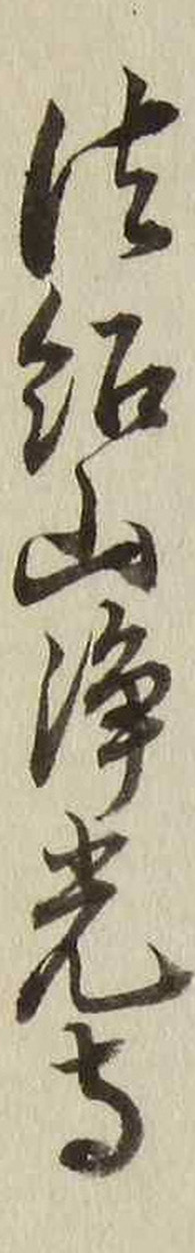法紹山浄光寺

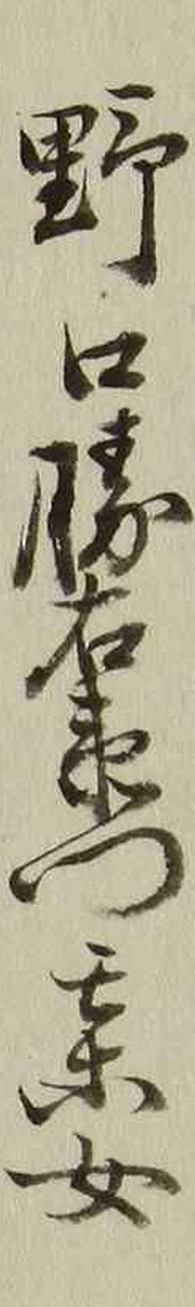野口勝右衛門某女
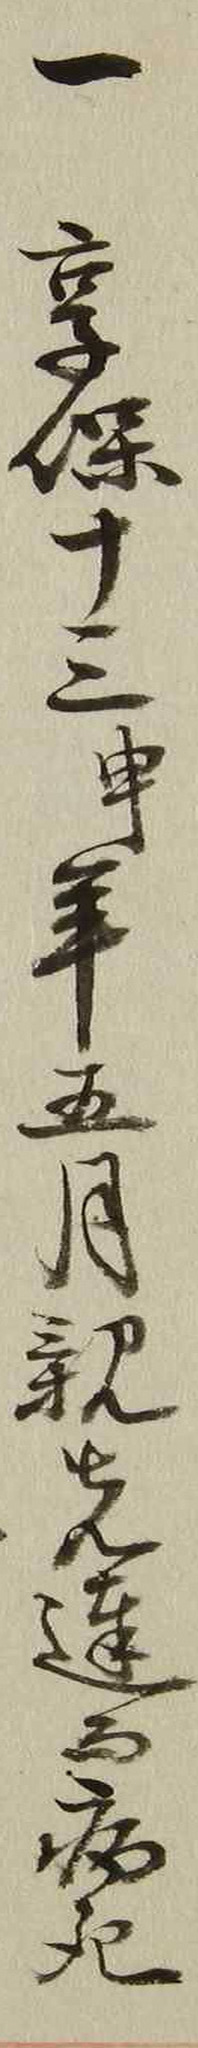一享保十三申年五月親先達而病死
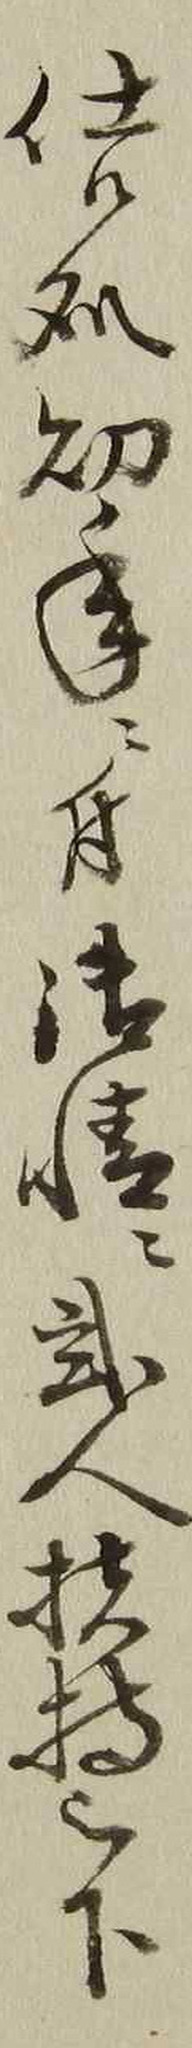仕候処幼年ニ付御情ニ弐人扶持被下
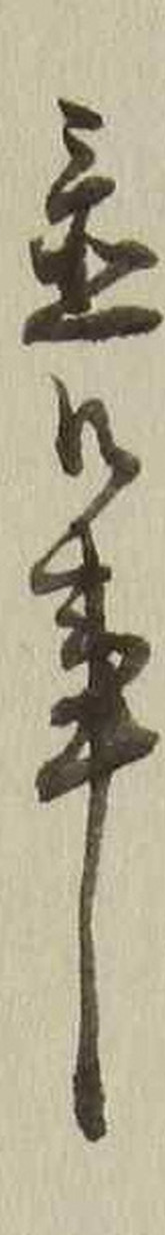置候事
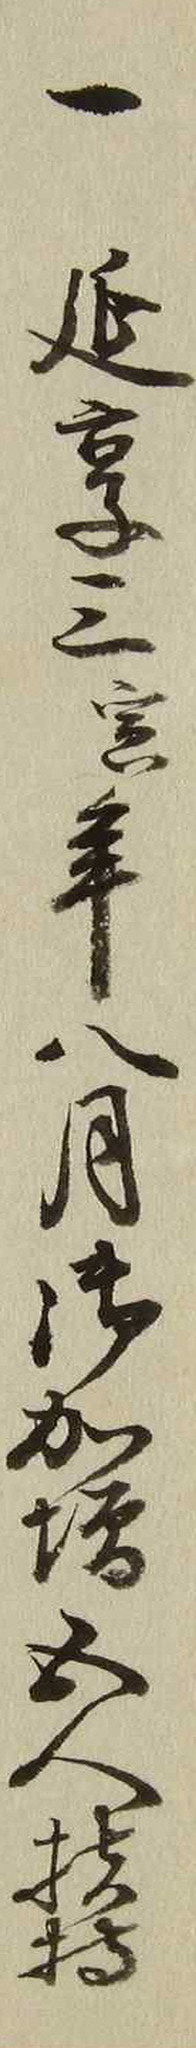一延享三寅年八月御加増五人扶持
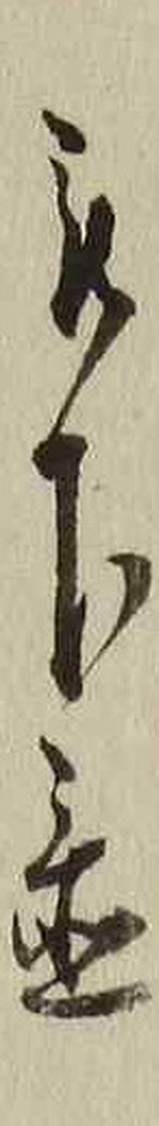被下置
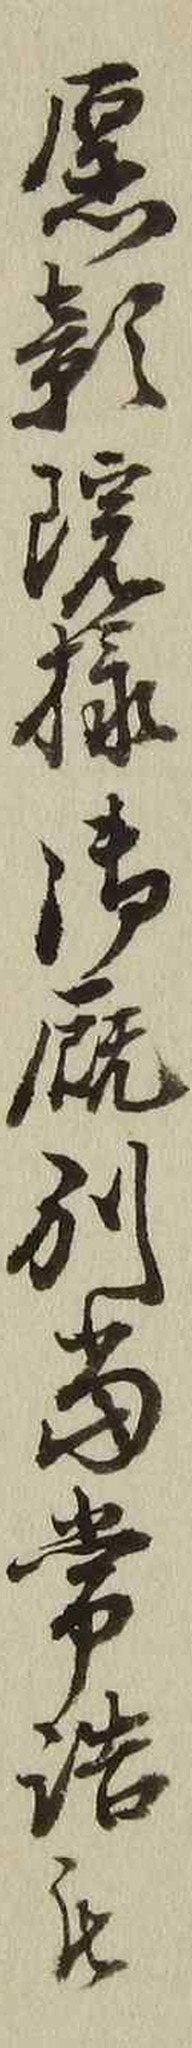愿彰院様御厩別当所常詰被
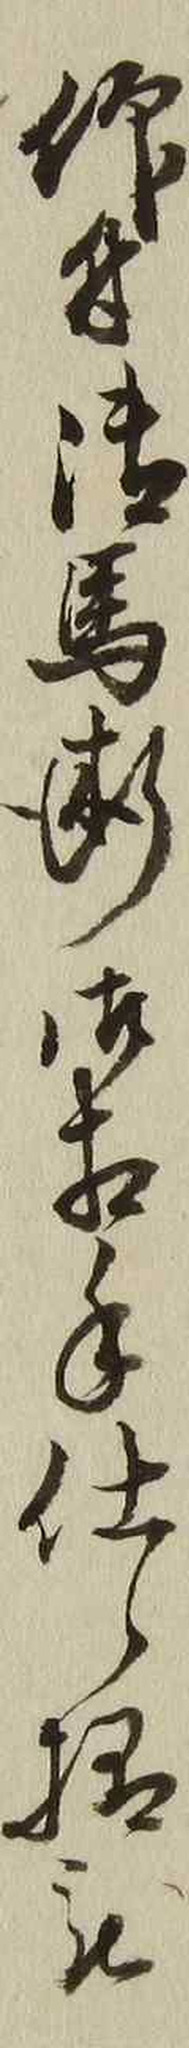仰付御馬術御相手仕候様被
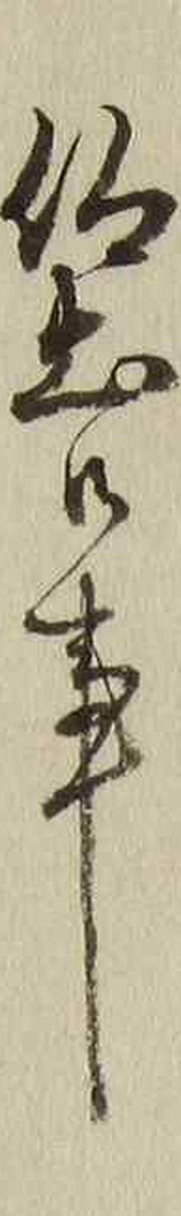仰出候事
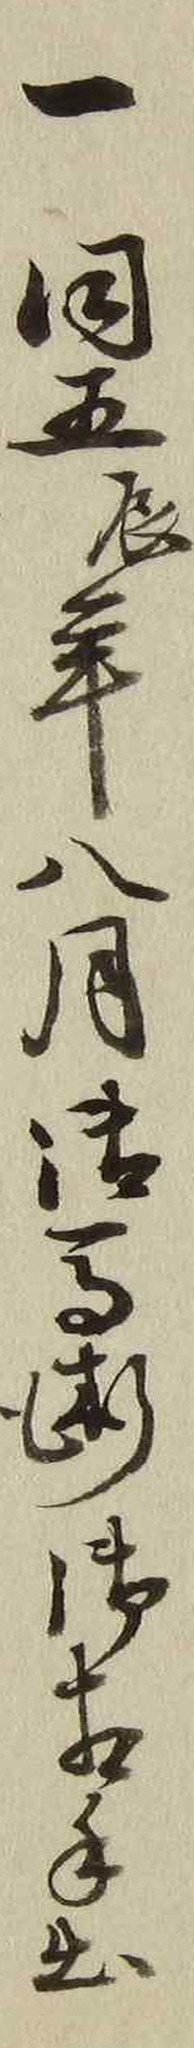一同五辰年八月御馬術御相手出
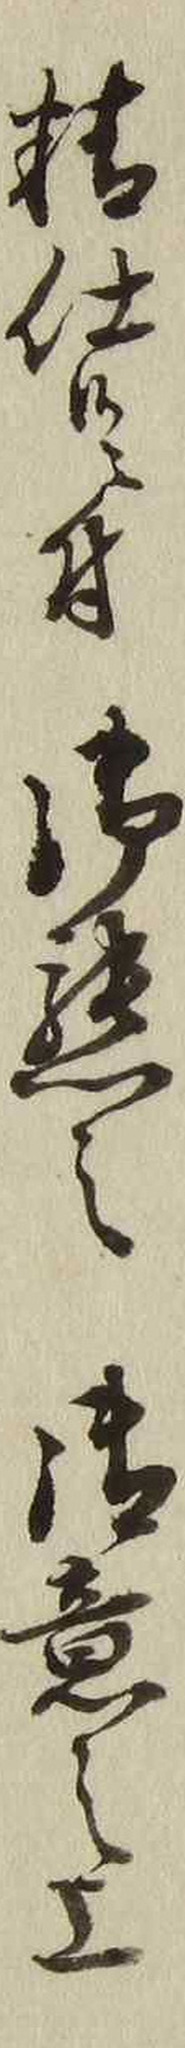精仕候ニ付御懇之御意之上
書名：諸士系譜　巻之31　い之部31
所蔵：会津若松市立会津図書館
